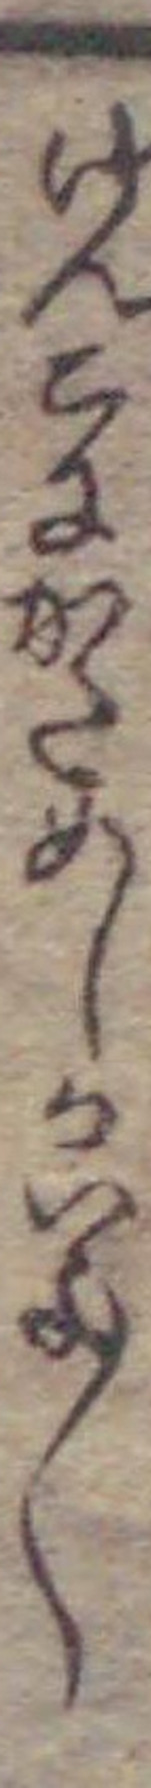けんこにかためしかいよ〳〵
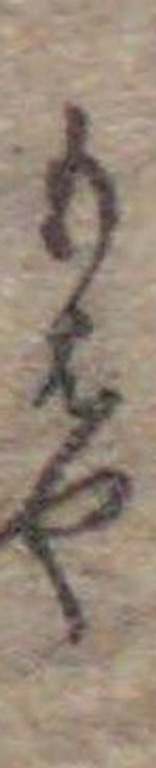もはや
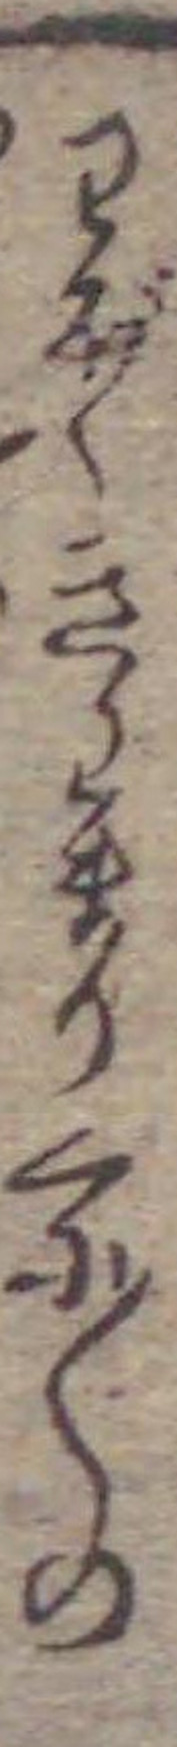わぼくきまりくに〳〵の
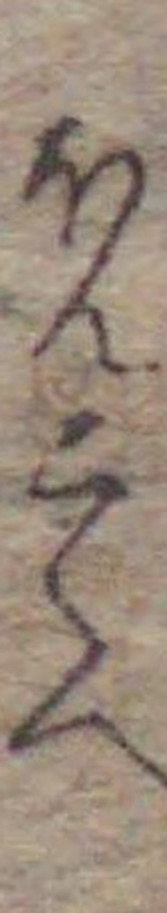ほんこくへ
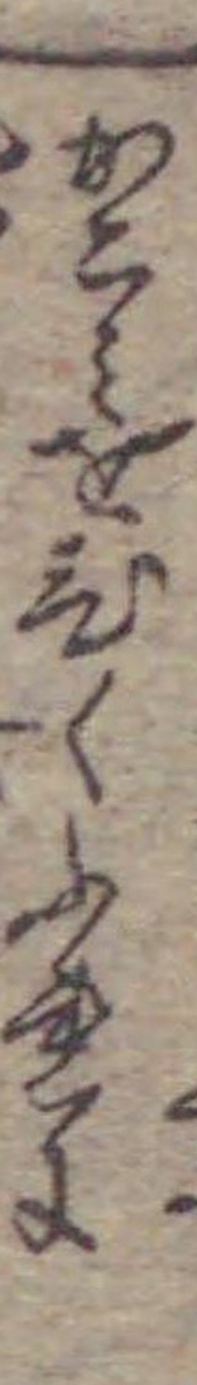かこみをひくふれに
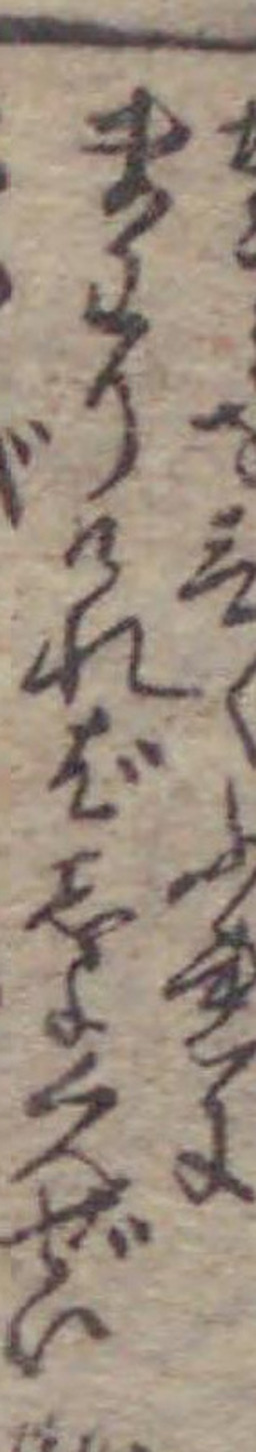まわりければしよくんぜい
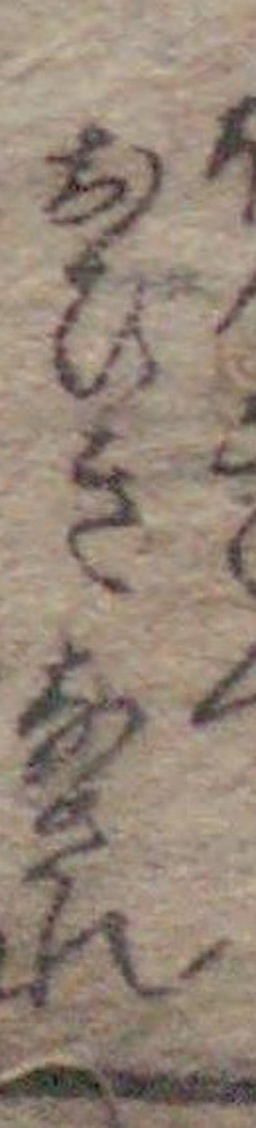おひきなされ
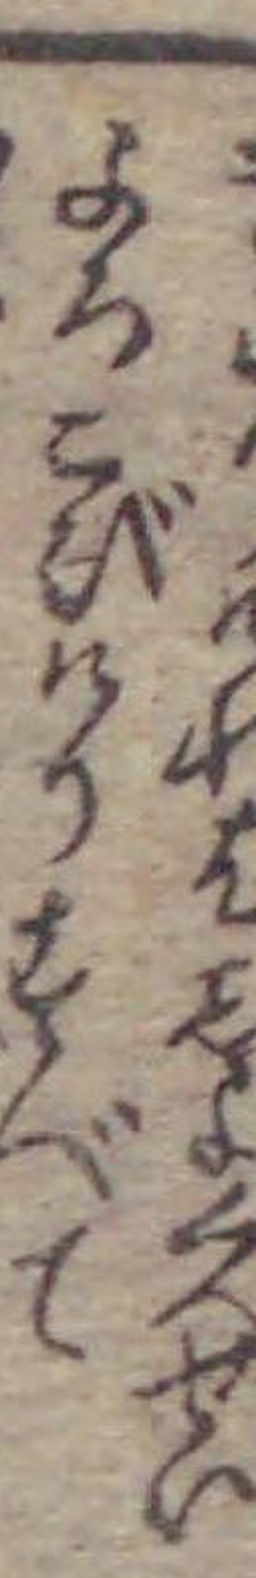よろこびけりすべて
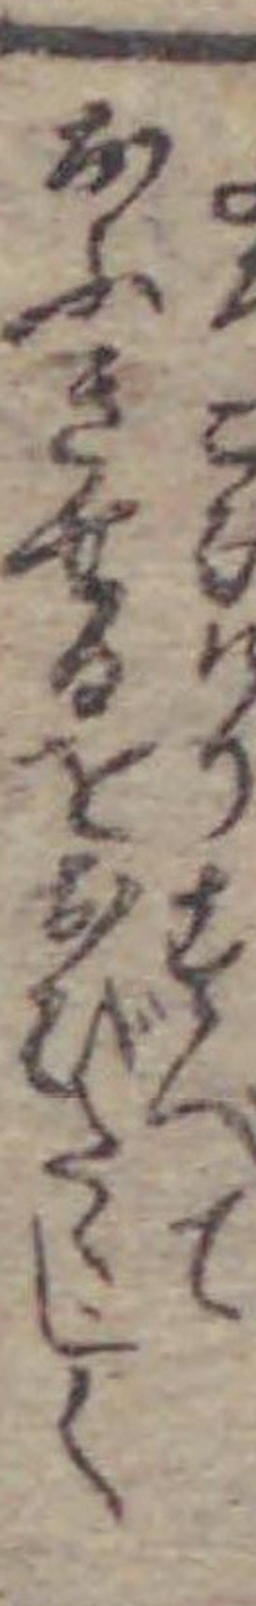おふきせるをおびたゝしく
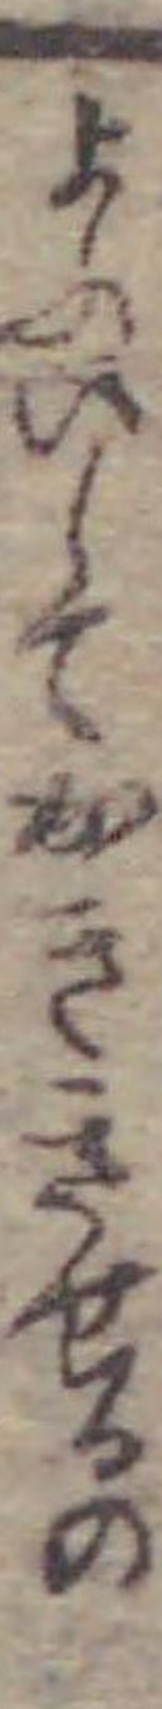よふいしておききせるの
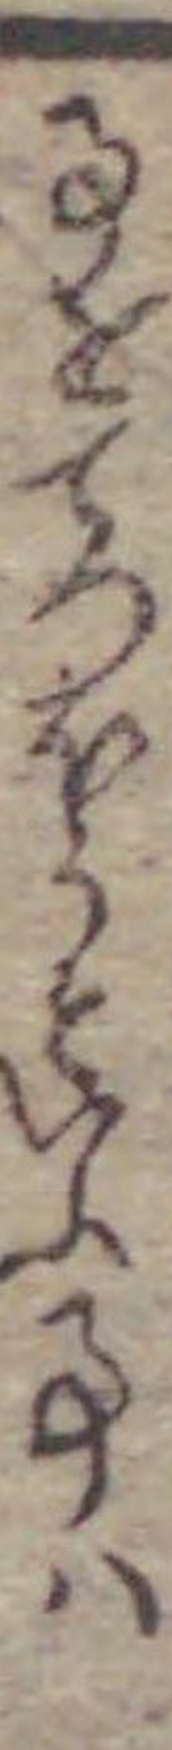事をてつほうといふ事は
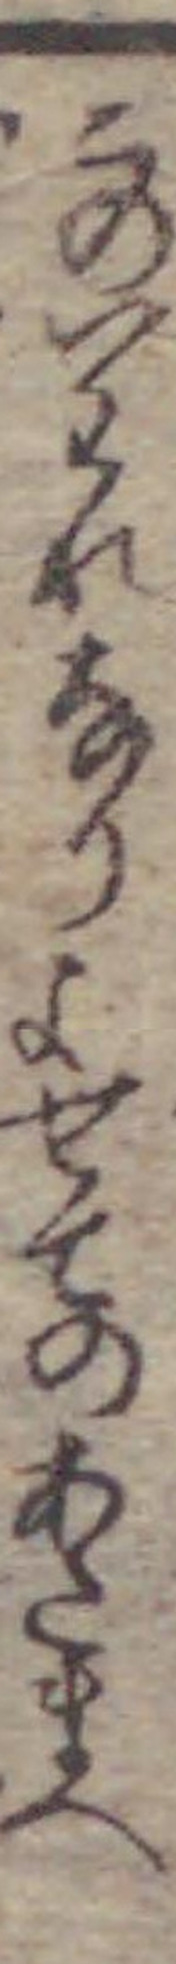このいわれなりよせてのあたまへ
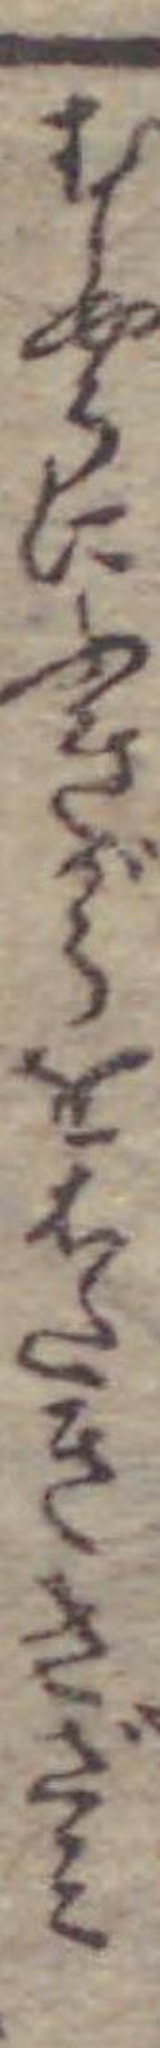むしやうにふきがうをはたききざみ
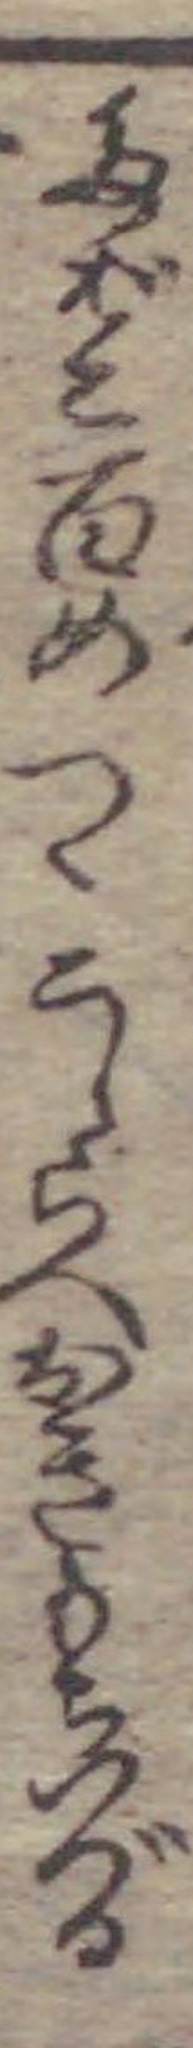たばこ百めつゝこしらへおきもちいづる
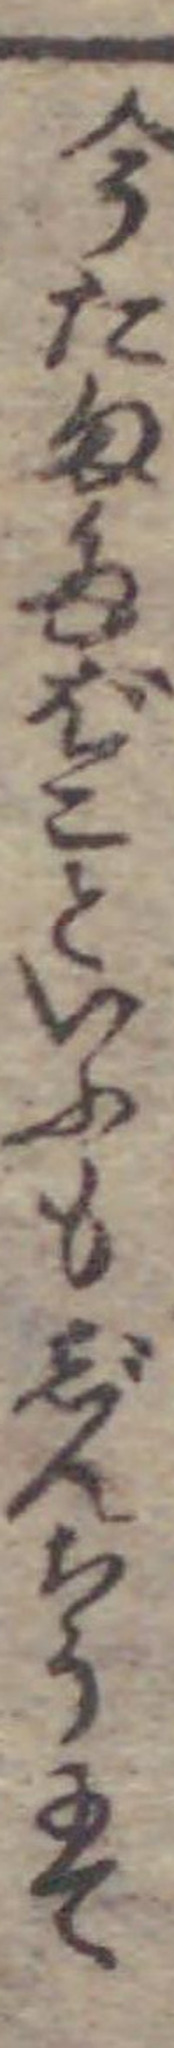今たまたばこといふもじんちうにて
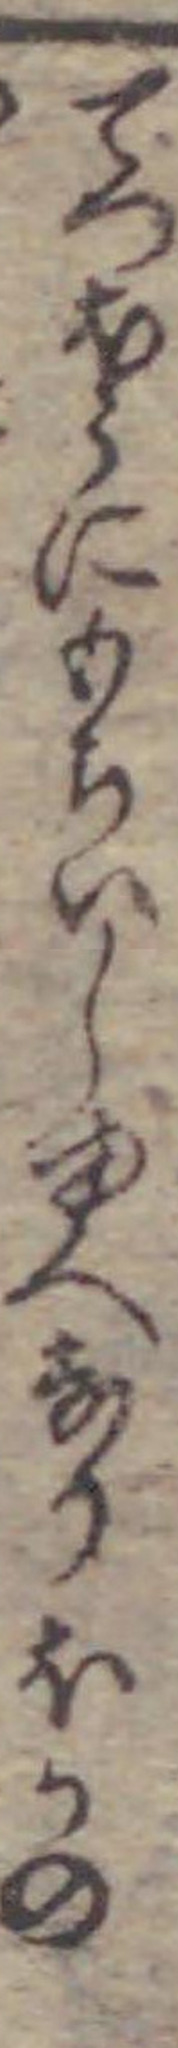てつほうにもちいしゆへなりほかの
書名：談芭菰誉詞 : 3巻
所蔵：国立国会図書館 National Diet Library, JAPAN
